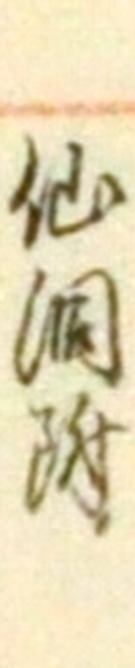仙洞附
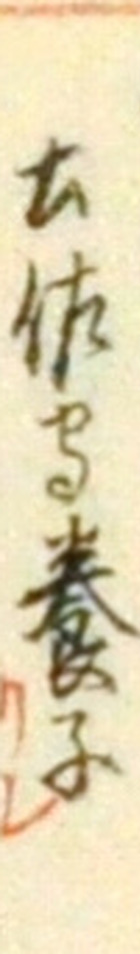土佐守養子
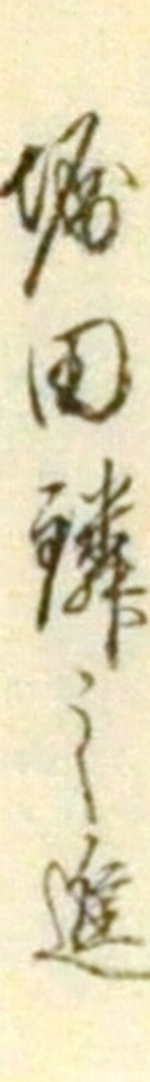堀田鏻之進
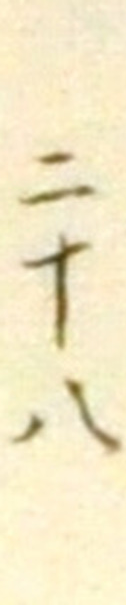二十八

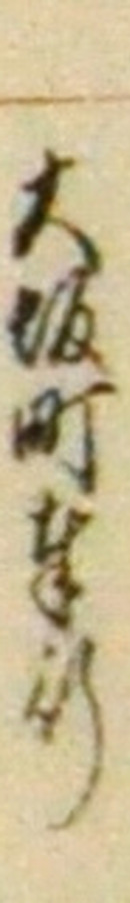大坂町奉行
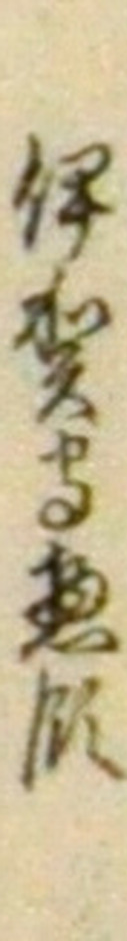伊賀守惣領
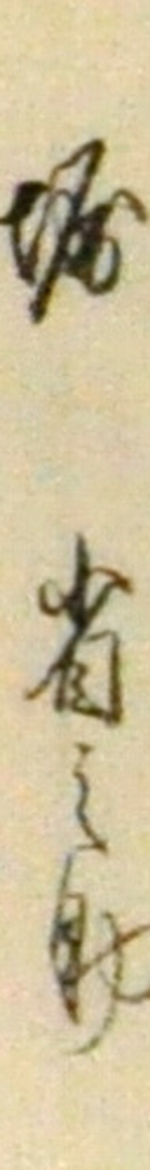堀省之助
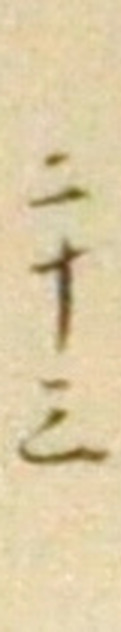二十三
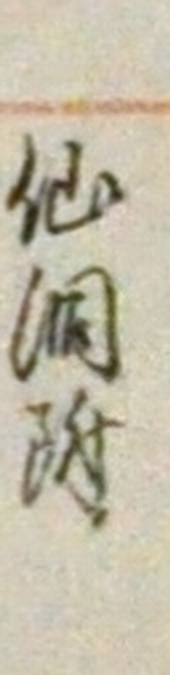仙洞附
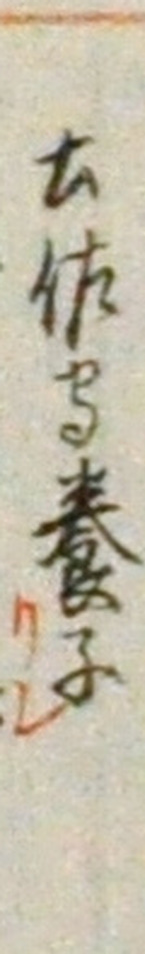土佐守養子
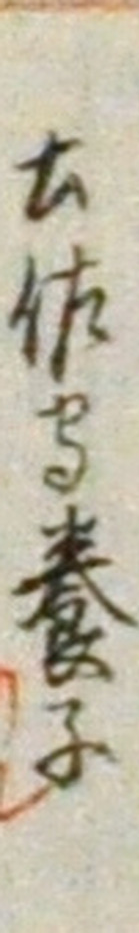土佐守養子
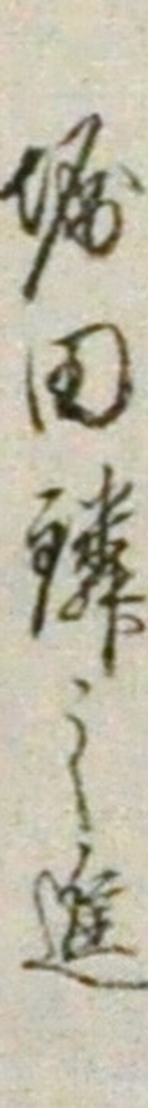堀田鏻之進
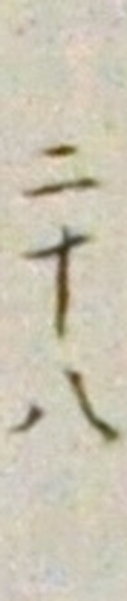二十八
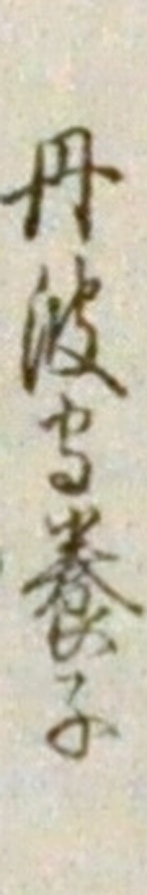丹波守養子
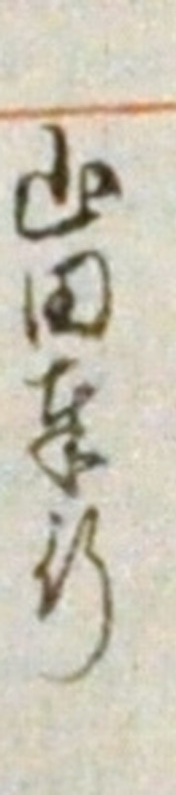山田奉行
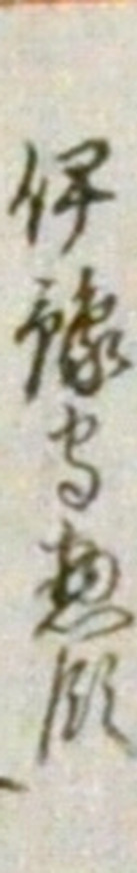伊予守惣領
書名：若年寄御役中之御書物〔一括〕
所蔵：伊那市立高遠町図書館・合同会社AMANE
